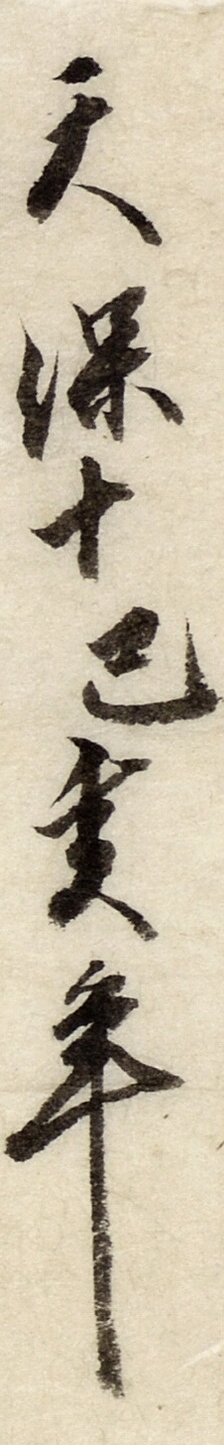天保十己亥年
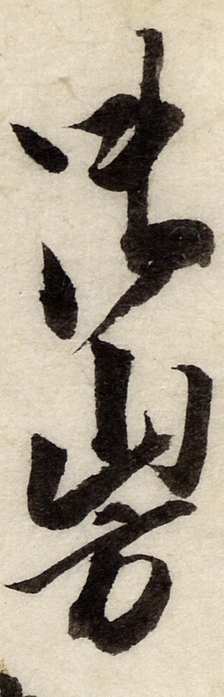御山方
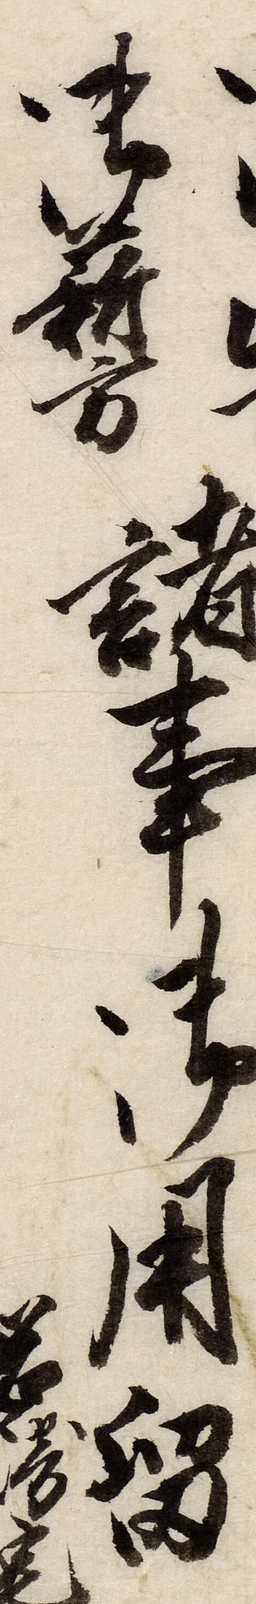御薪方諸事御用留
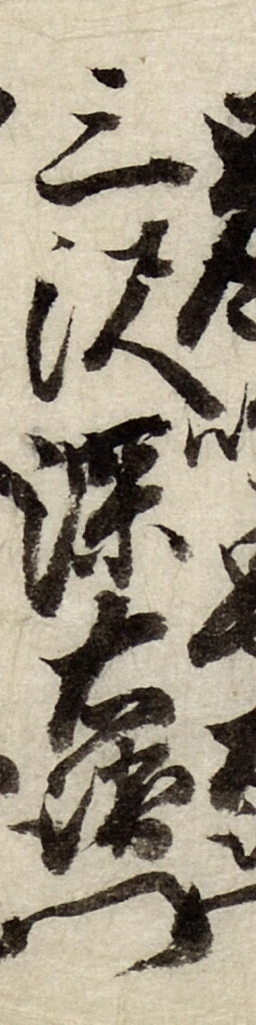三沢深右衞門
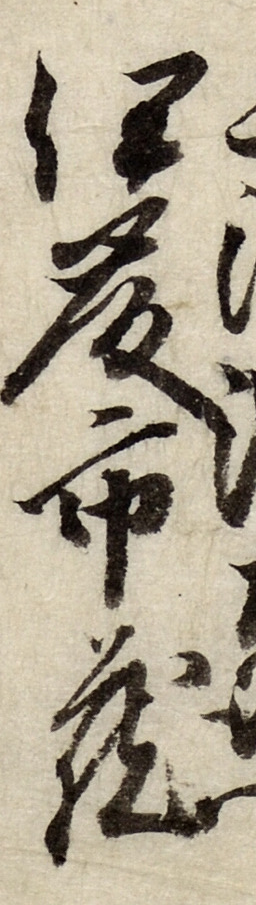伊藤市蔵
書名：御山方御薪方諸事御用留
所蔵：伊那市立高遠町図書館・合同会社AMANE
